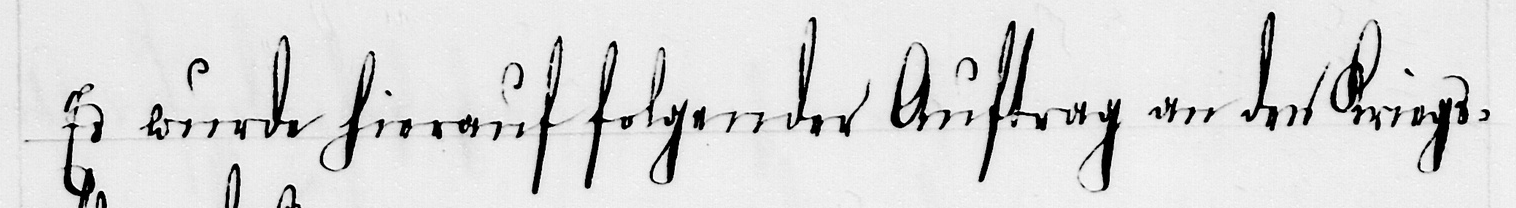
Es wurde hierauf folgender Auftrag an den Kriegs¬
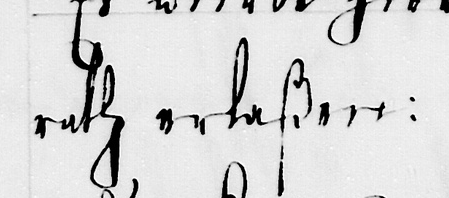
rath erlaßen:
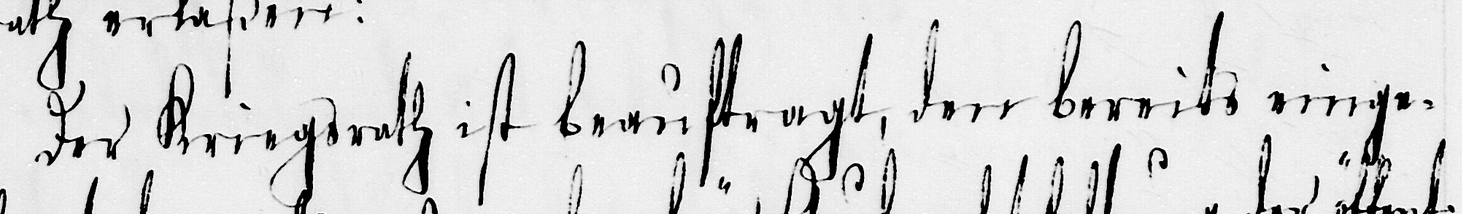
Der Kriegsrath ist beauftragt, den bereits einge¬
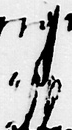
t,
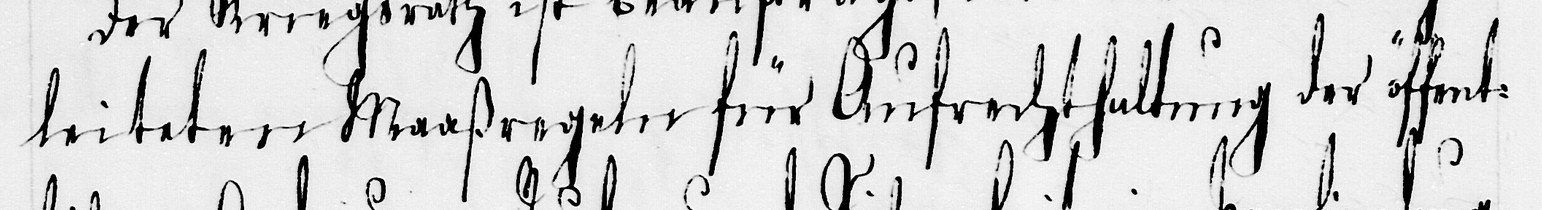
leiteten Maaßregeln für Aufrechthaltung der öffen¬
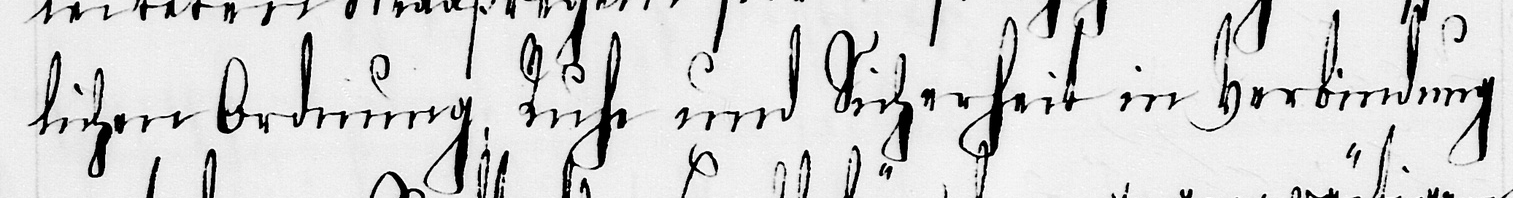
tlichen Ordnung, Ruhe und Sicherheit in Verbindung
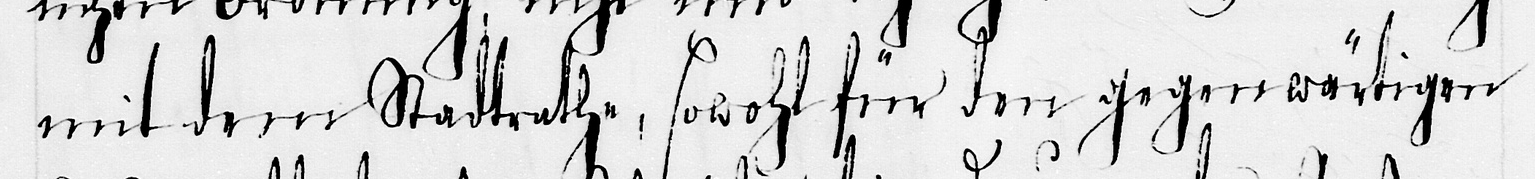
mit dem Stadtrathe, sowohl für den gegenwärtigen
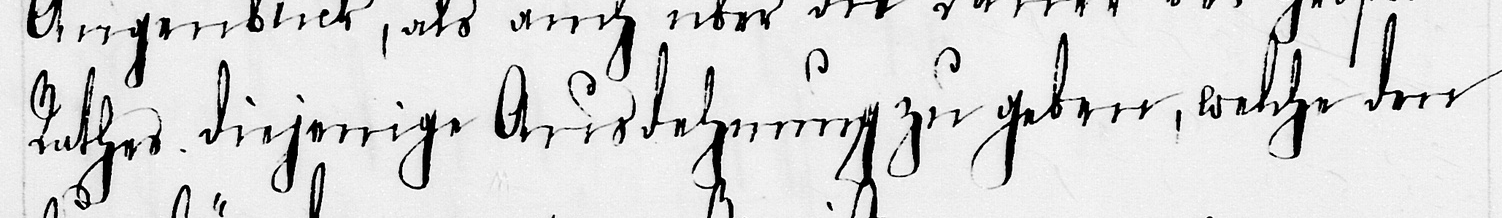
Rathes diejenige Ausdehnung zu geben, welche den
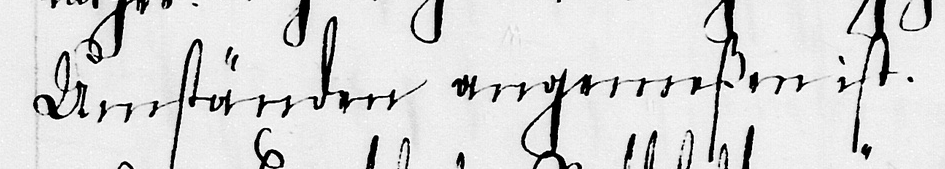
Umständen angemeßen ist.
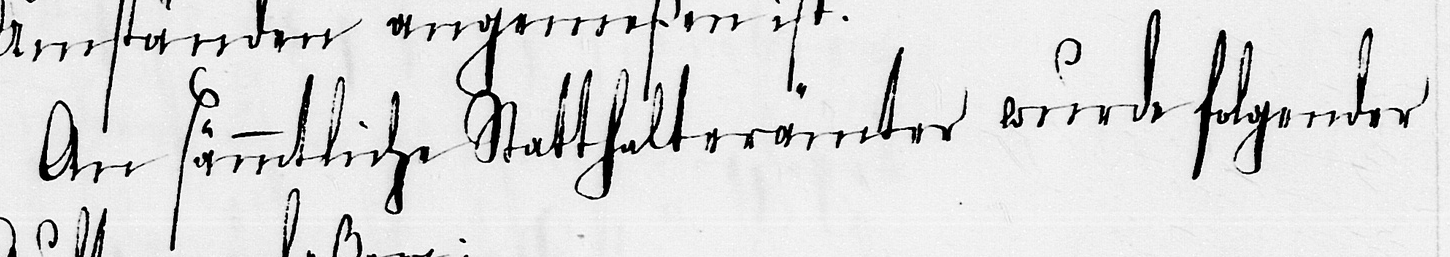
An sämmtliche Statthalterämter wurde folgender
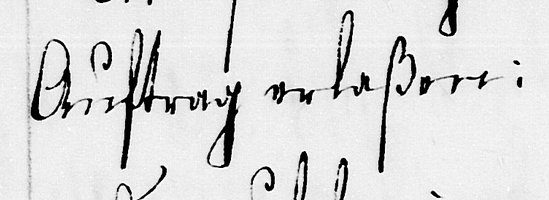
Auftrag erlaßen:
